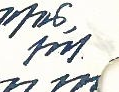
sich
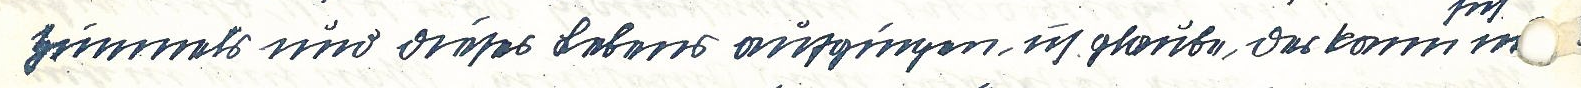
Himmels und dieses Lebens aufgingen, ich glaube, der kann ni
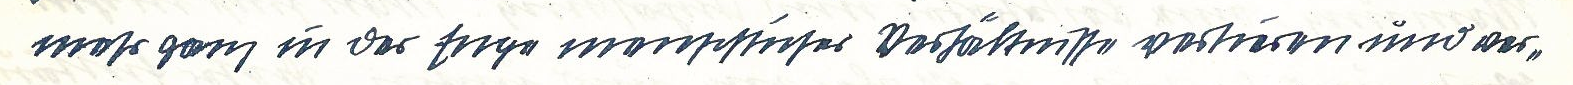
mehr ganz in der Enge menschlicher Verhältnisse verlieren und ver¬
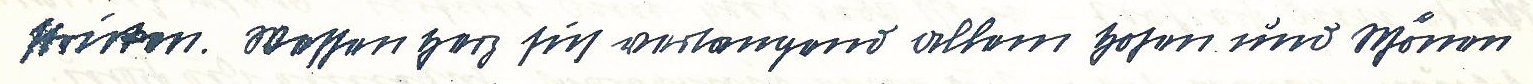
stricken. Wessen Herz sich verlangend allem Hohen und Schönen
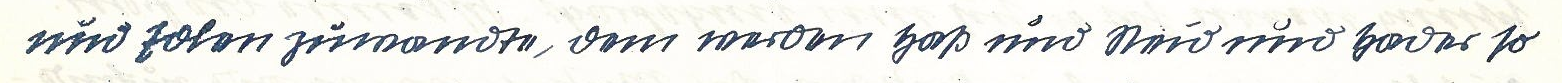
und Edlen zuwandte, dem werden Hass und Neid und Hader so
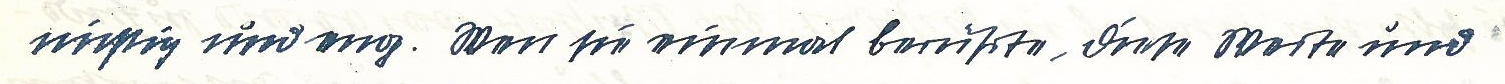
nichtig und eng. Wen sie einmal berührte, diese Werke und
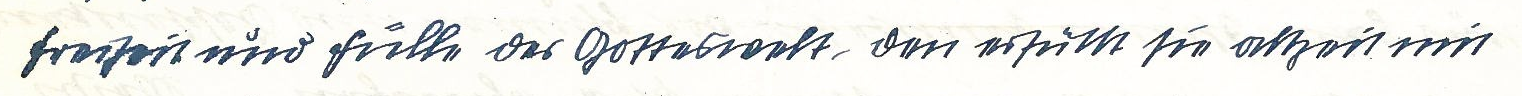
Freiheit und Fülle der Gotteswelt, den erfüllt sie allzeit mit
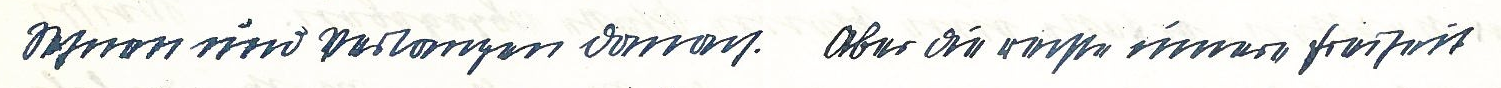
Sehnen und Verlangen danach. Aber die rechte innere Freiheit
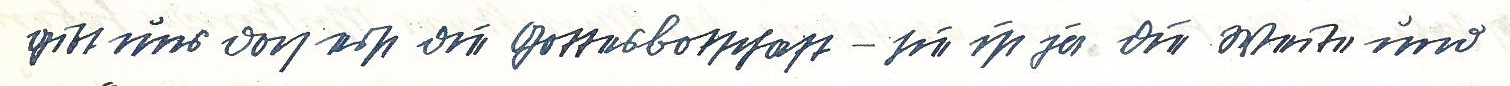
gibt uns doch erst die Gottesbotschaft – sie ist ja die Weite und
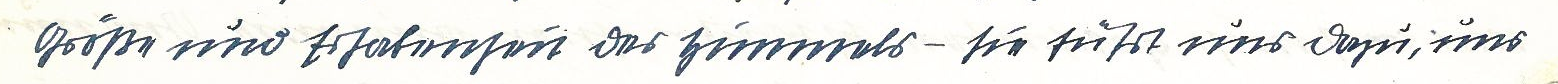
Größe und Erhabenheit des Himmels – sie führt uns dazu, uns
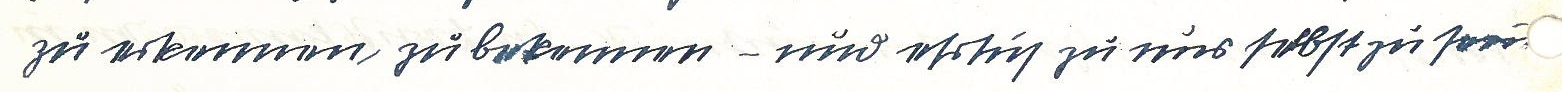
zu erkennen, zu bekennen – und ehrlich zu uns selbst zu sein.
